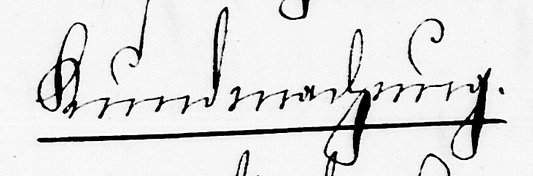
Kundmachung.
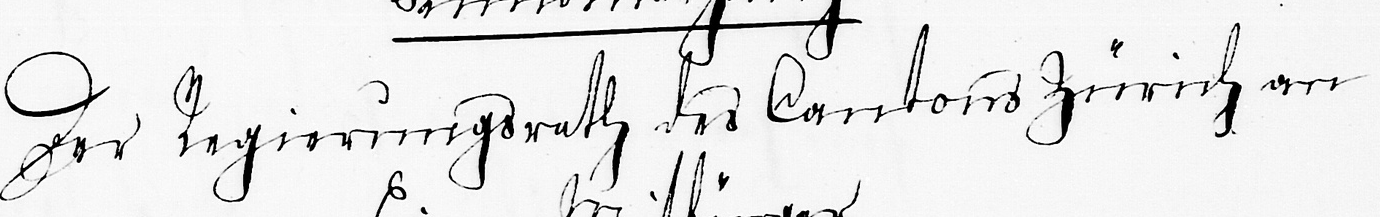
Der Regierungsrath des Cantons Zürich an
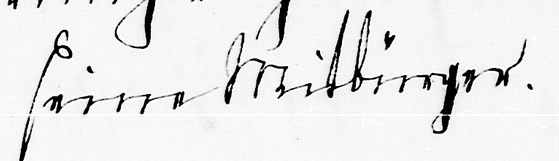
seine Mitbürger.
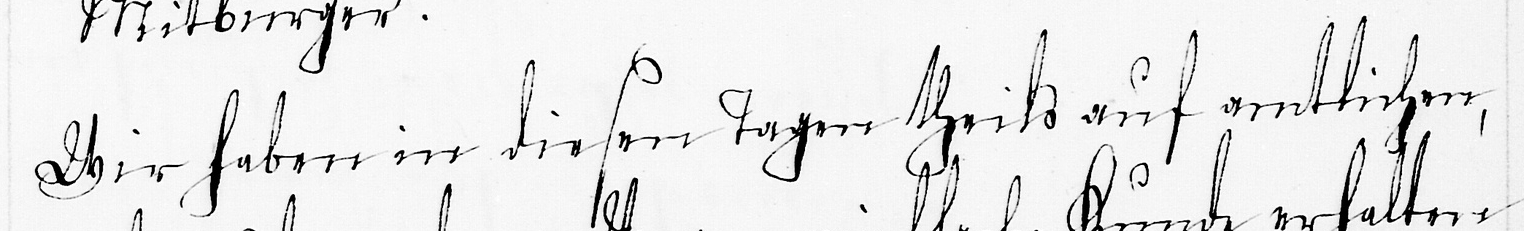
Wir haben in diesen Tagen theils auf amtlichen,
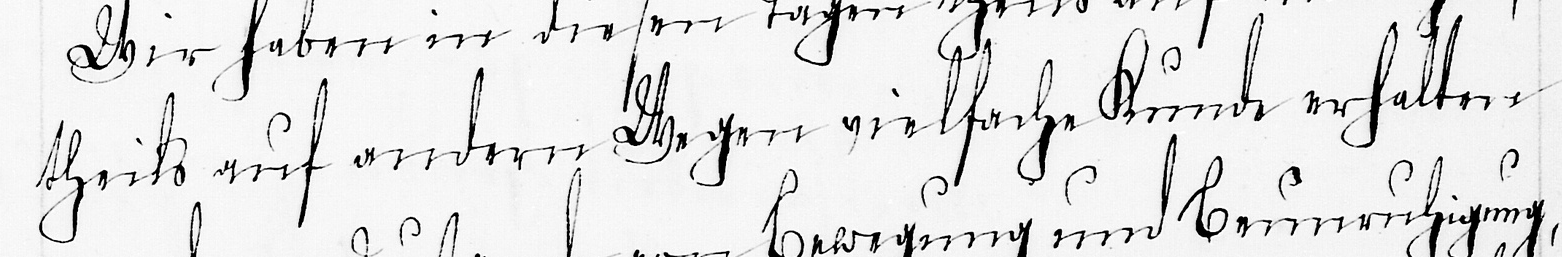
theils auf andern Wegen vielfache Kunde erhalten
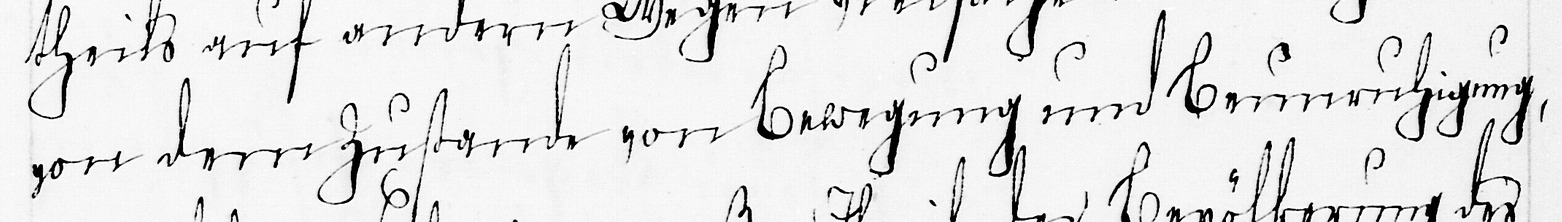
von dem Zustande von Bewegung und Beunruhigung,
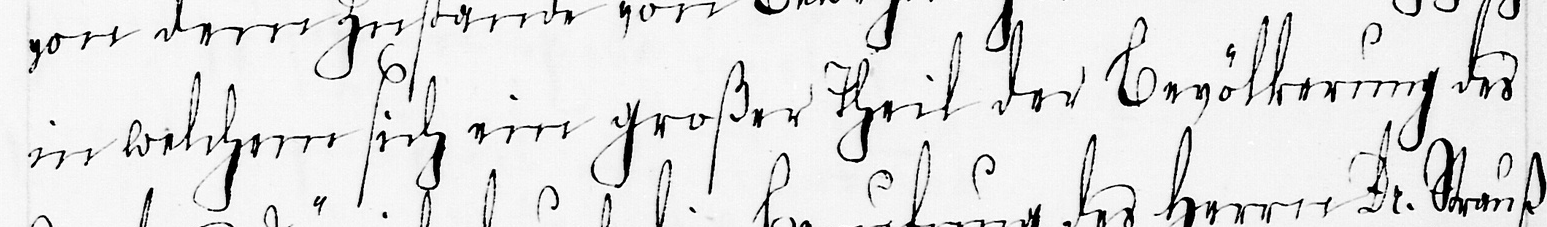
in welchem sich ein großer Theil der Bevölkerung des
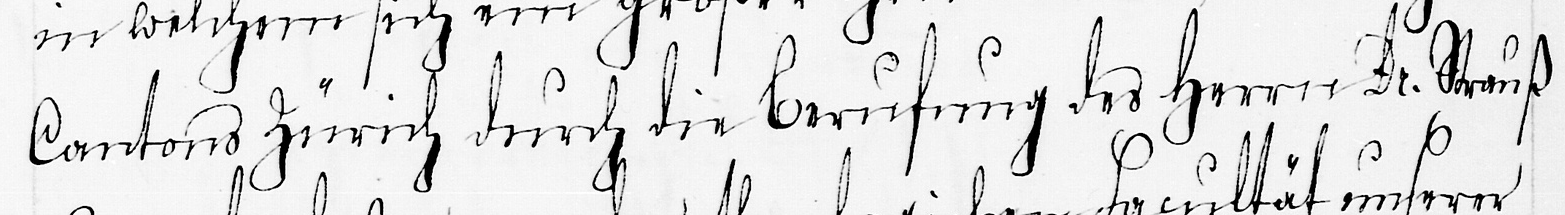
Cantons Zürich durch die Berufung des Herrn Dr. Strauß
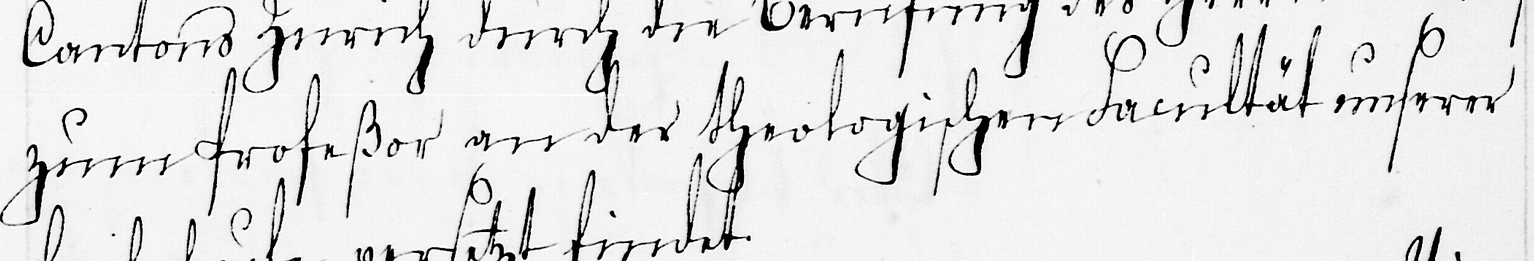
zum Profeßor an der theologischen Facultät unserer
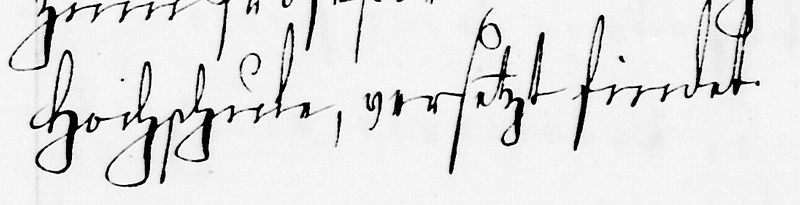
Hochschule, versetzt findet.
